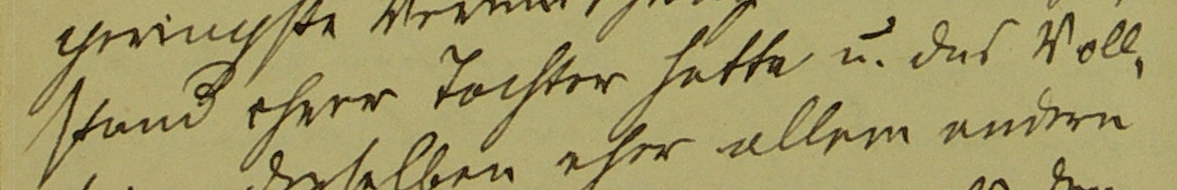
stand ihrer Tochter hatte und das Voll¬
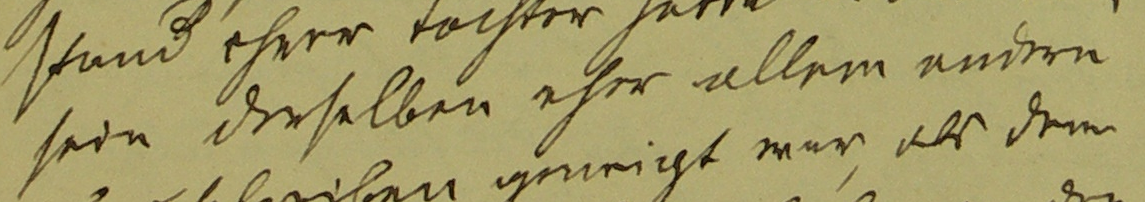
sein derselben eher allem anderen
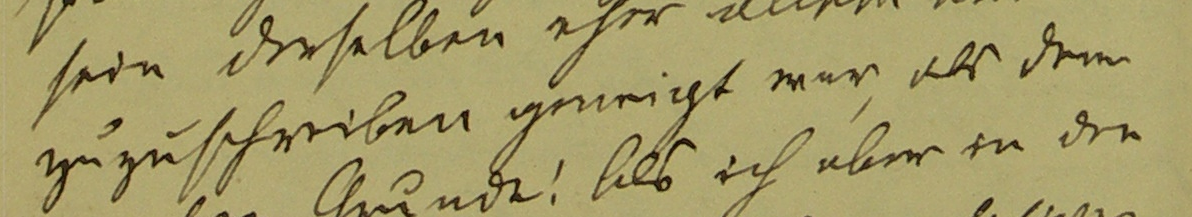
zuzuschreiben geneigt war als dem
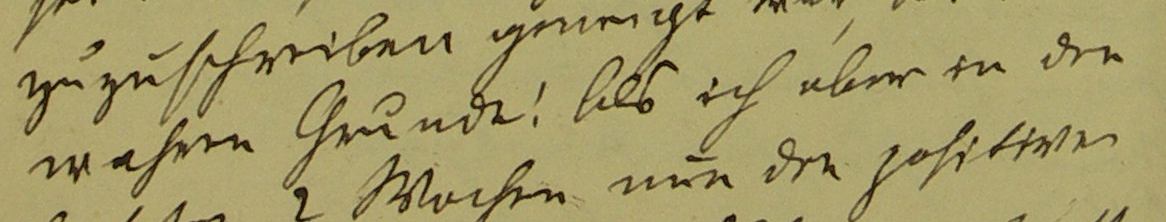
wahren Grund !,-Als ich aber in den
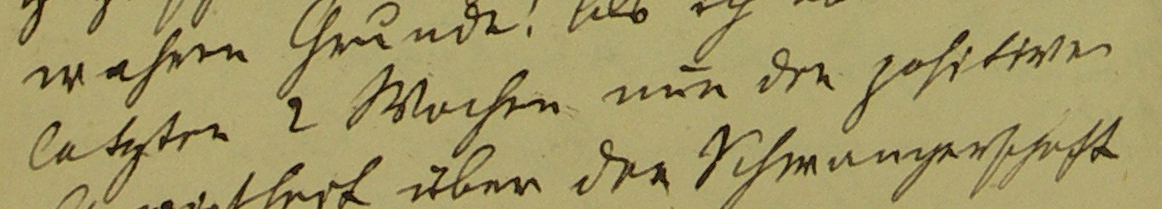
letzten 2 Wochen nun die positiven
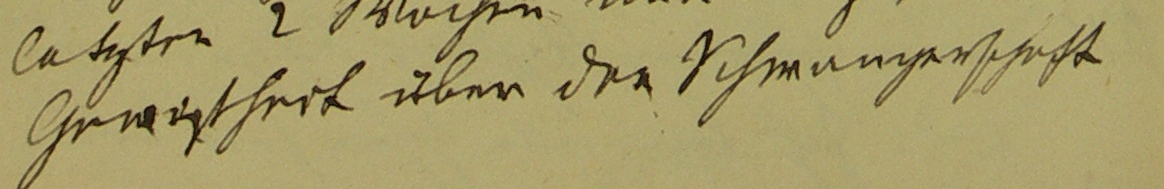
Gewißheit über die Schwangerschaft
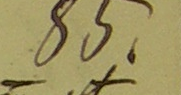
85
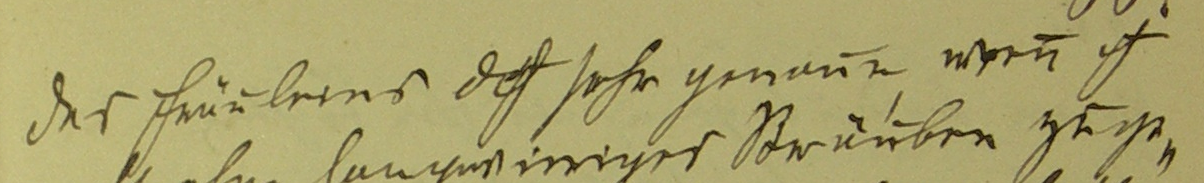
des Fräuleins durch sehr genaue, wenn auch
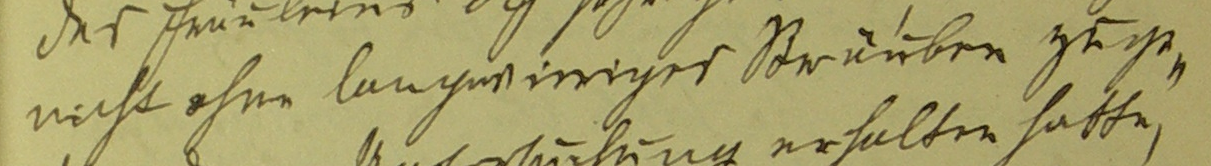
nicht ohne langwieriges Sträuben zuge¬
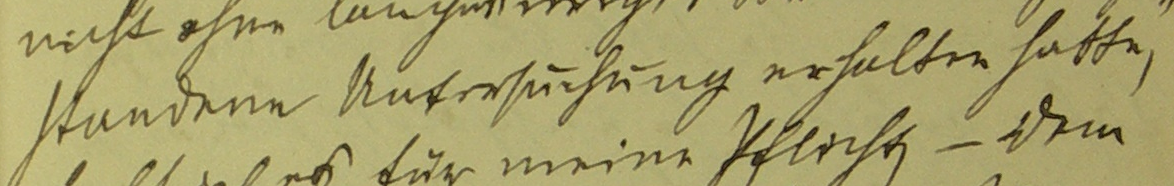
standene Untersuchung erhalten hatte ,
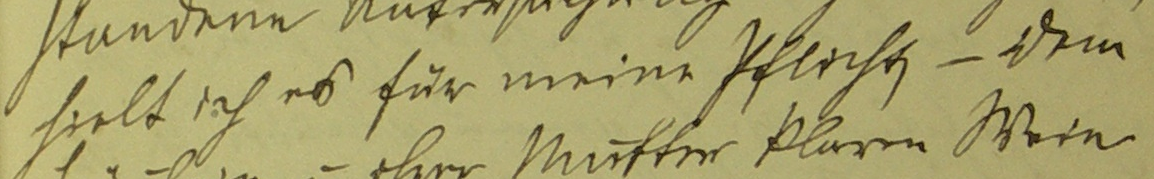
hielt ich es für meine Pflicht-dem
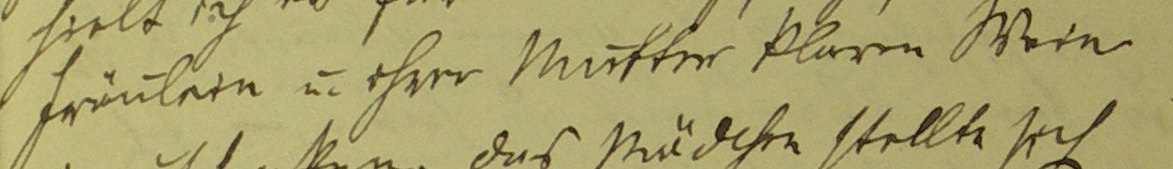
Fräulein und ihrer Mutter klaren Wein
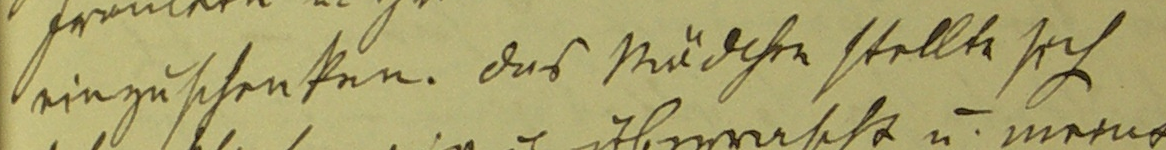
einzuschenken. Das Mädchen stellte sich
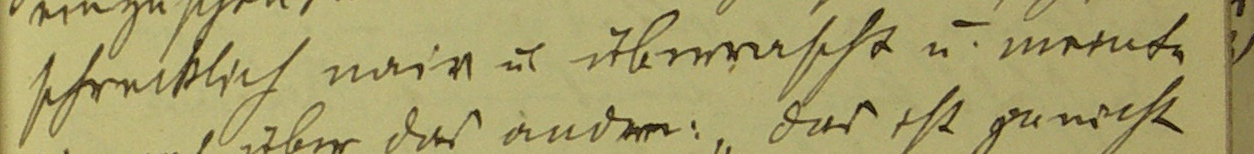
schrecklich naiv und überrascht und meinte
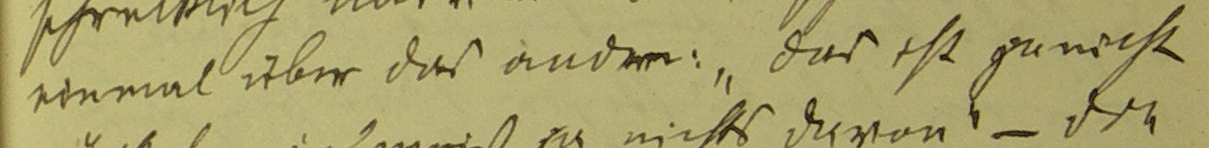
einmal über das andere:“ das ist gar nicht
